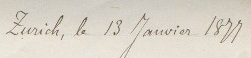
Zurich, le 13 Janvier 1877
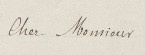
Cher Monsieur
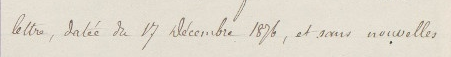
lettre, datée du 17 Décembre 1876, et sans nouvelles
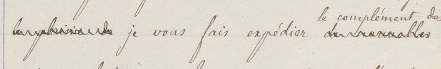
le plaisir de je vous fais expédier des nouvellesle
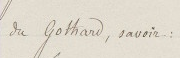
du Gothard, savoir:
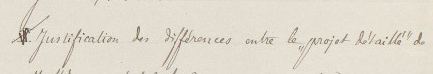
I. Justification des différences entre le «projet détaille» de
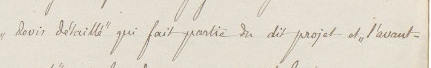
«devis détaillé» qui fait partie du dit projet et «l'avant-
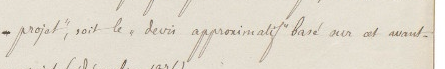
projet», soit le «devis approximatif» basé sur cet avant-
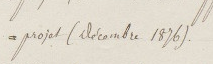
projet (Décembre 1876).
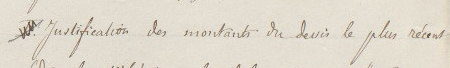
II. Justification des montants du devis le plus récent
